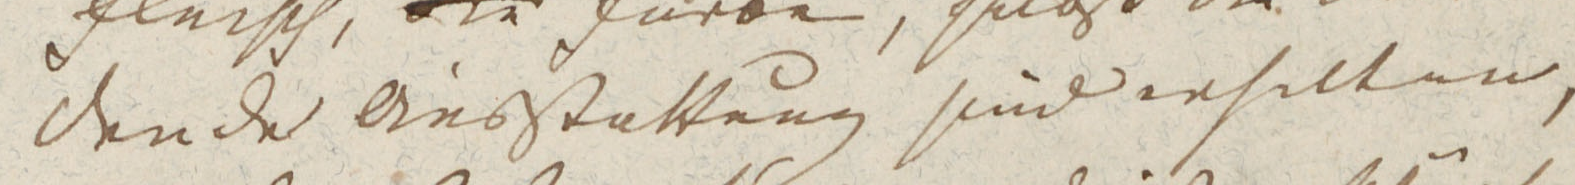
dende Ausstattung sind erhalten,
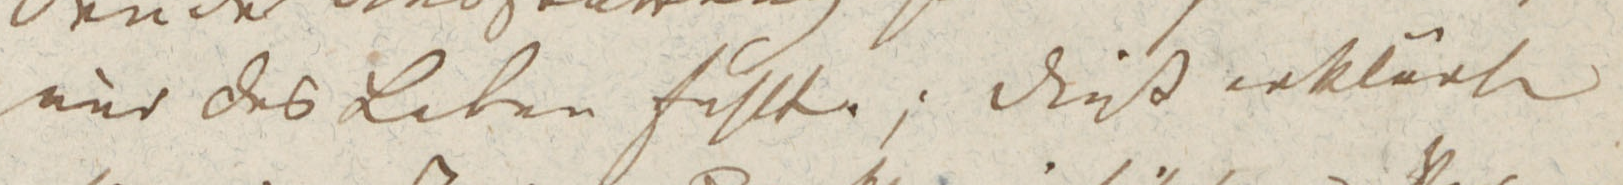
nur das Leben fehlt.; Diess erklärt
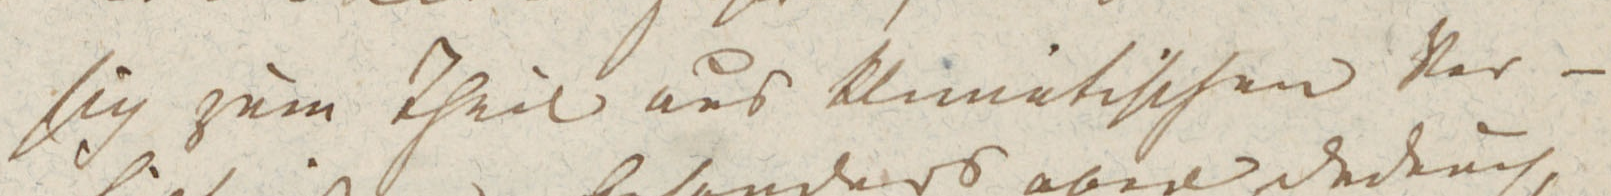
sich zum Theil aus klimatischen Ver-
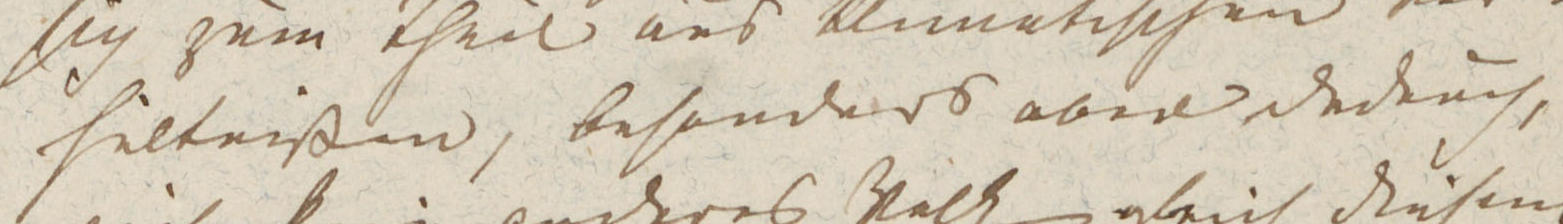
hältnissen, besonders aber dadurch,
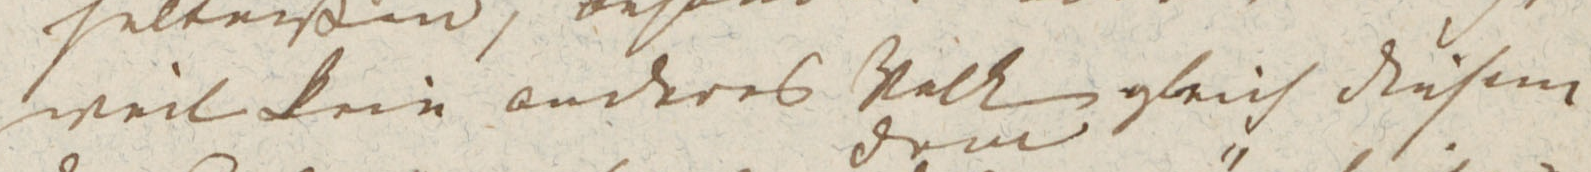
weil kein anderes Volk gleich diesem
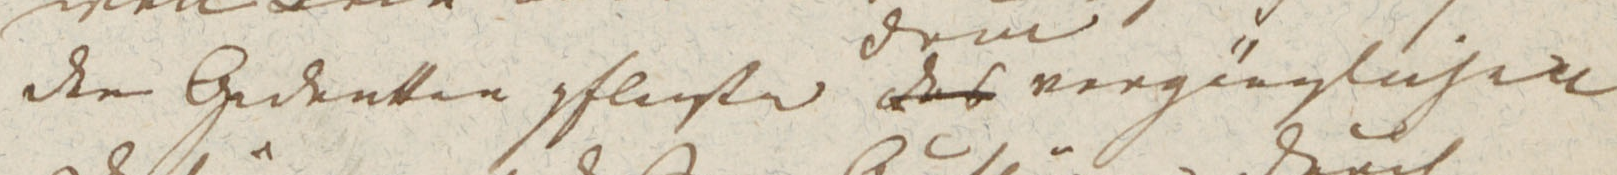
den Gedanken pflegte das dem vergänglichen
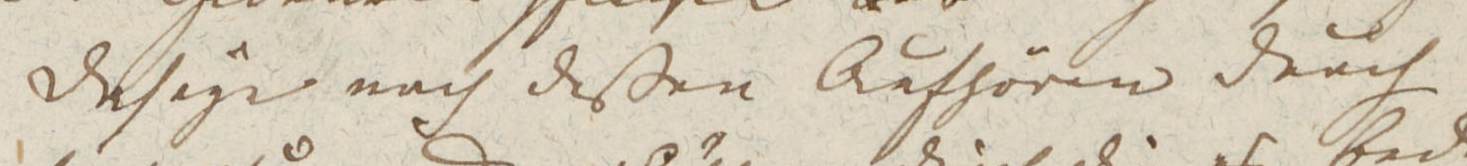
Daseyn nach dessen Aufhören durch
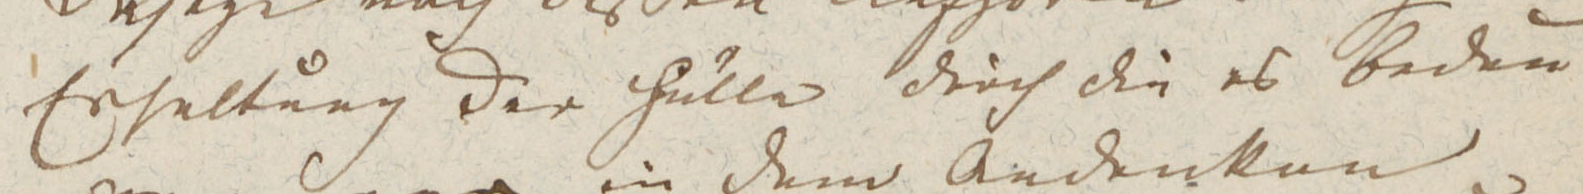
Erhaltung der Hülle durch die es bedun
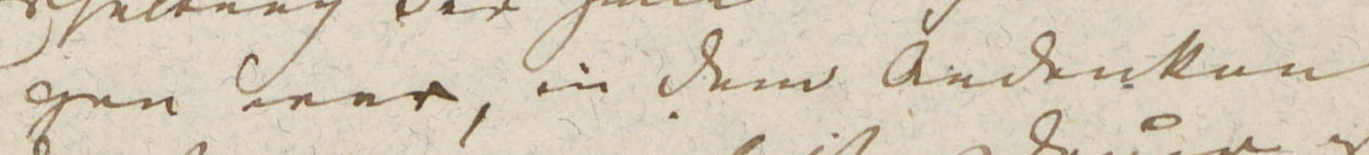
gen war, in dem Andenken
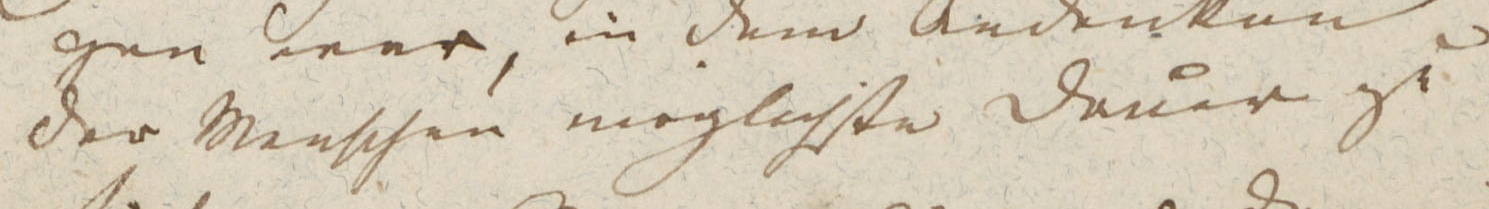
der Menschen möglichste Dauer zu
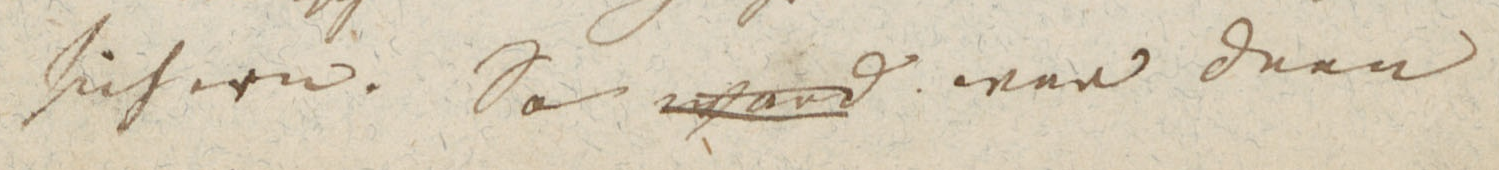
sichern. So ward war denn
